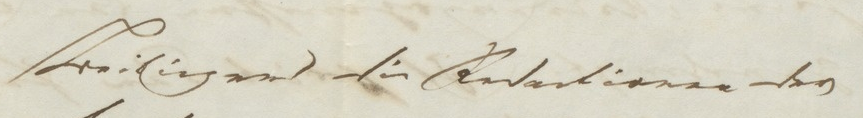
Beiliegend die Redactionen der
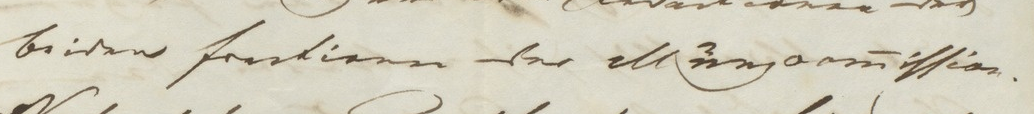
beiden Fractionen der Münzcommission.
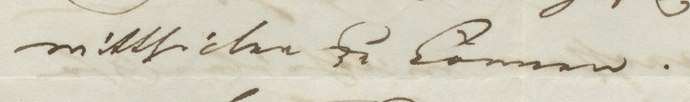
mittheilen zu können.
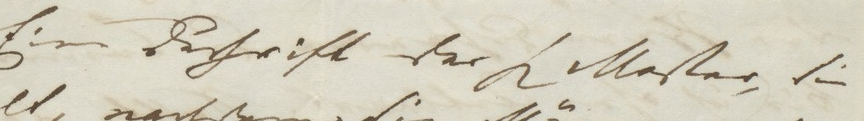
Eine Zuschrift des Herrn Master, die
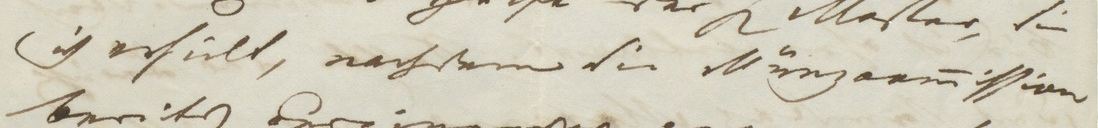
ich erhielt, nachdem die Münzcommission
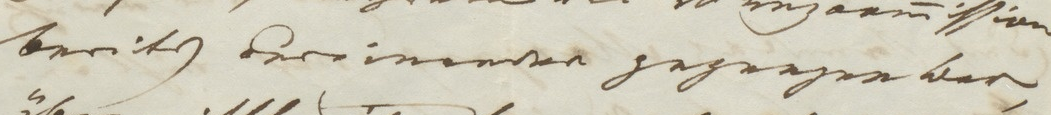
bereits auseinander gegangen war,
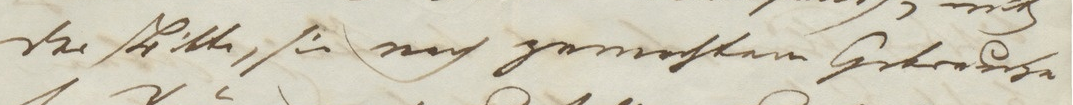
der Bitte, sie nach gemachtem Gebrauche
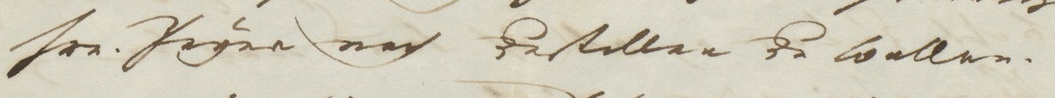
Hrn. Peyer noch zustellen zu wollen.
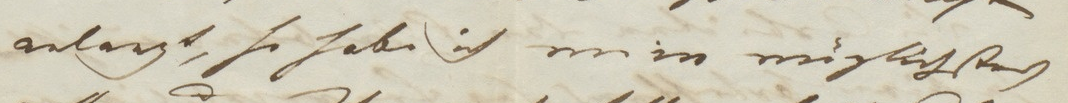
anlangt, so habe ich mein möglichstes
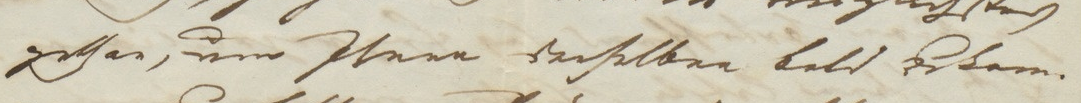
gethan, um Ihnen denselben bald zukom-
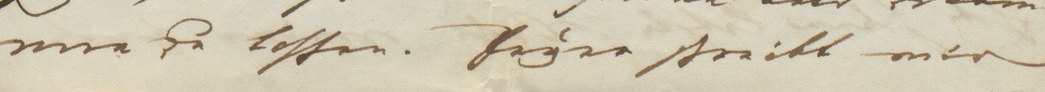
men zu lassen. Peyer schreibt mir
